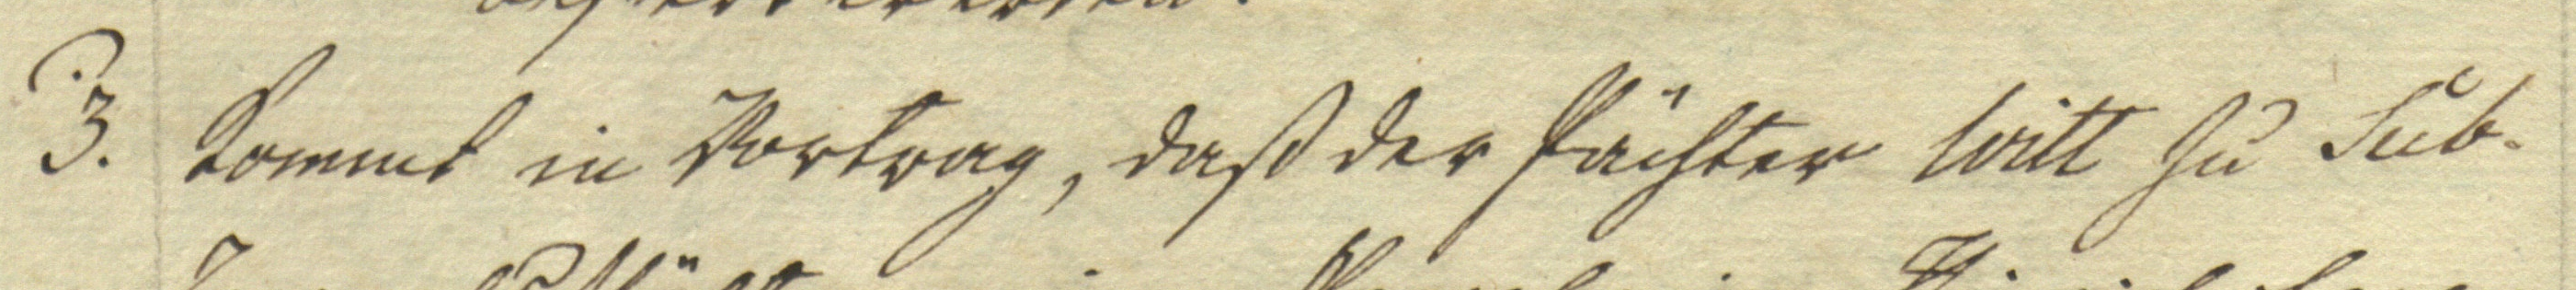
3. Kommt in Vortrag, daß der Pächter Witt zu Sub¬
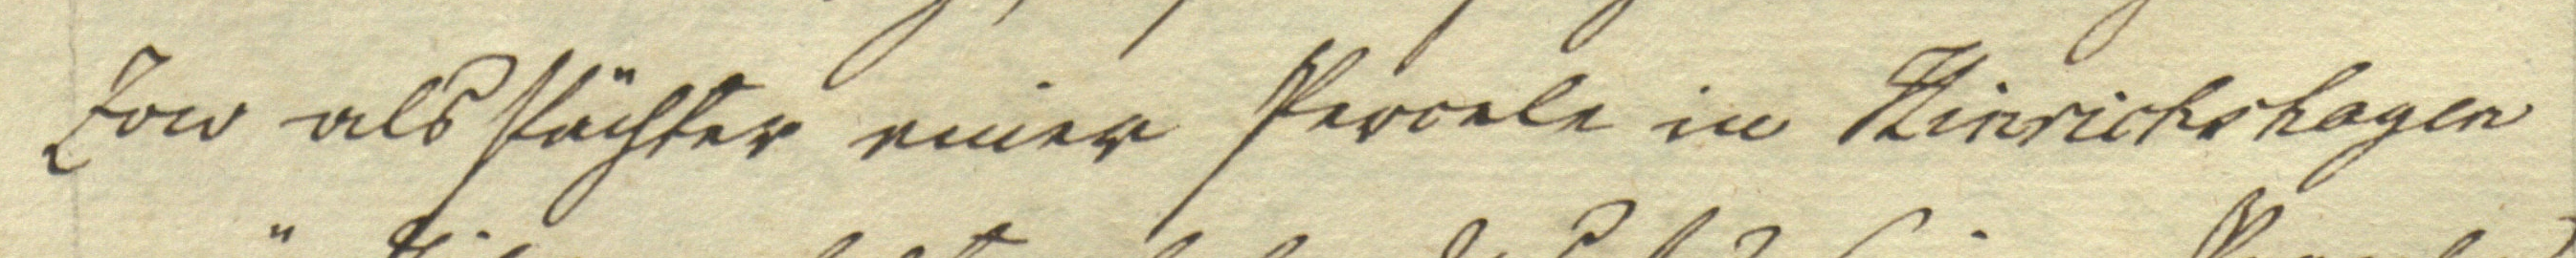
zow als Pächter einer Percele in Hinrichshagen
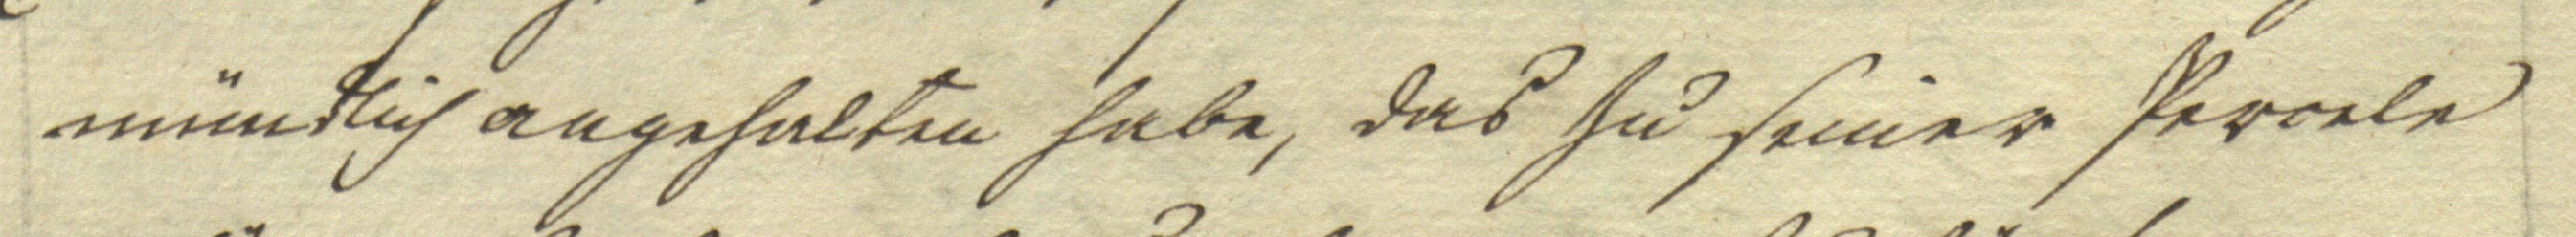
mündlich angehalten habe, das zu seiner Percele
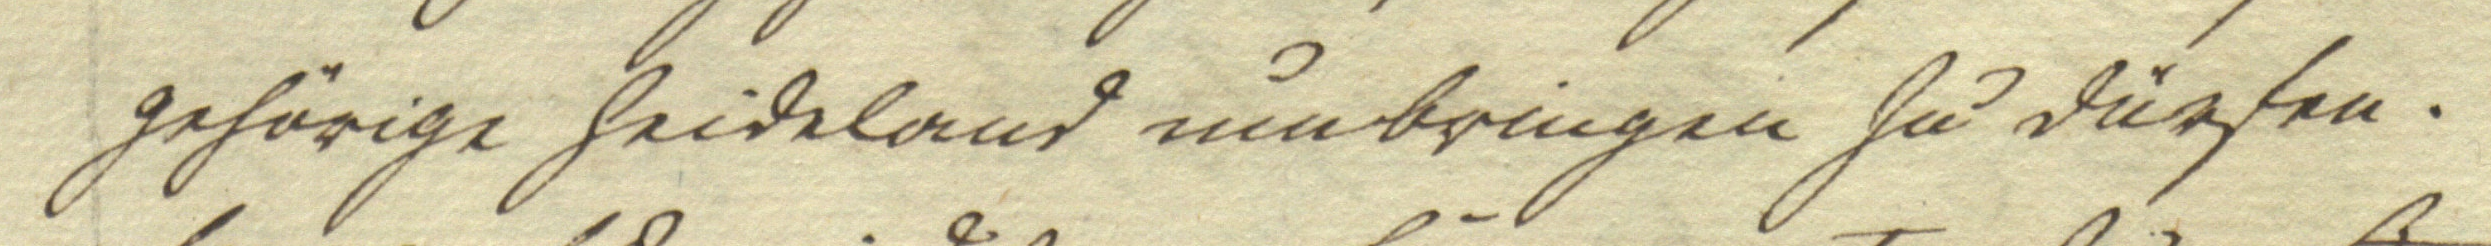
gehörige Heideland umbringen zu dürfen.
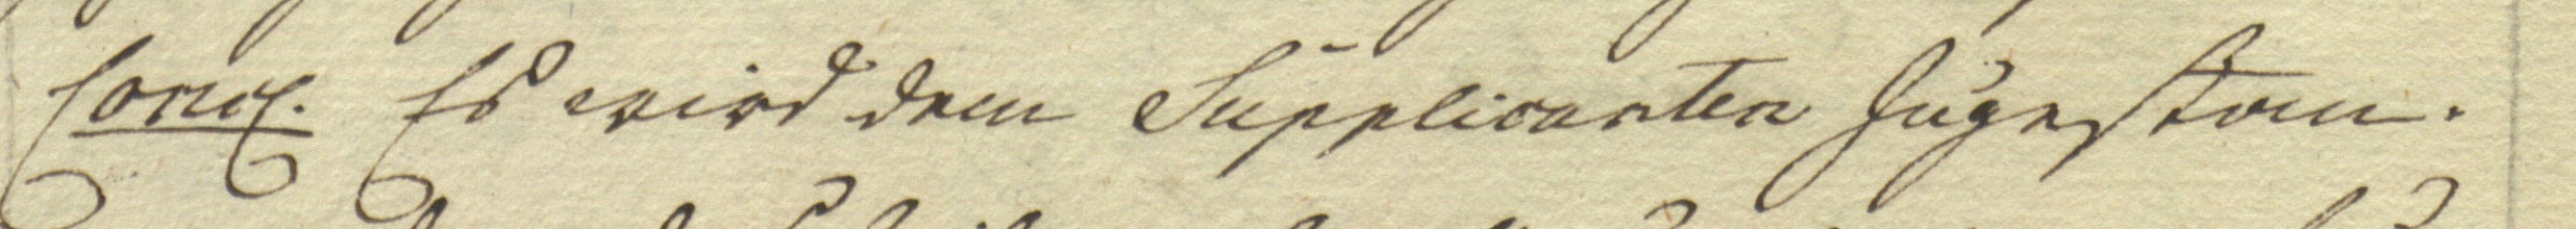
Concl. Es wird dem Supplicanten zugestan
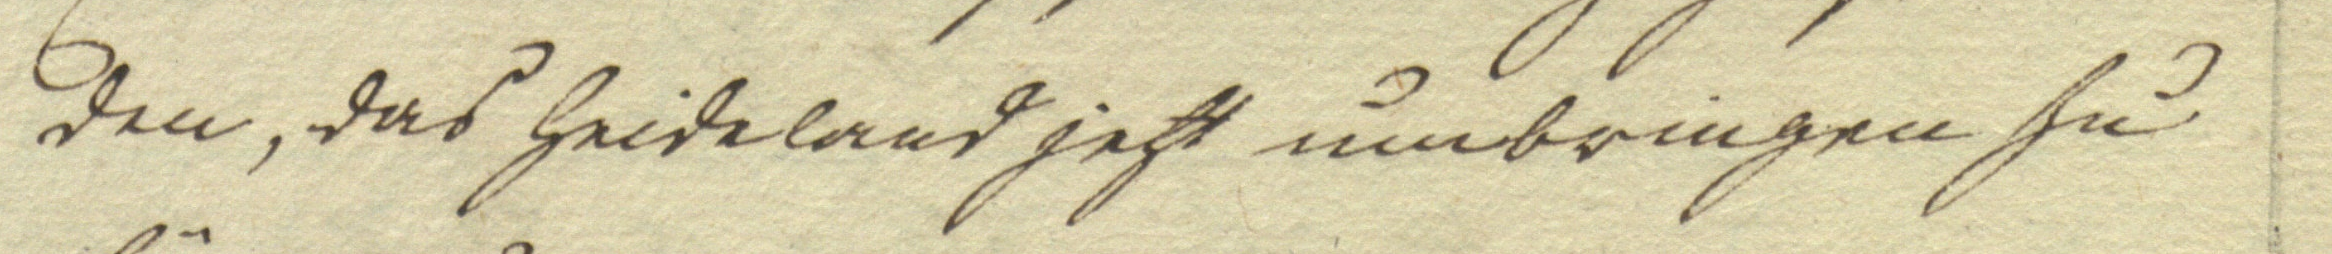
den, das Heideland jetzt umbringen zu
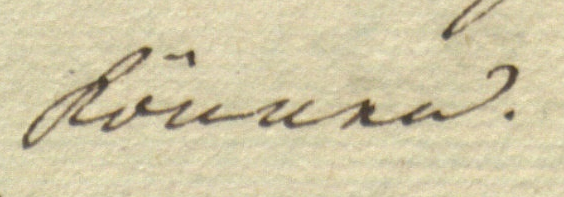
können.
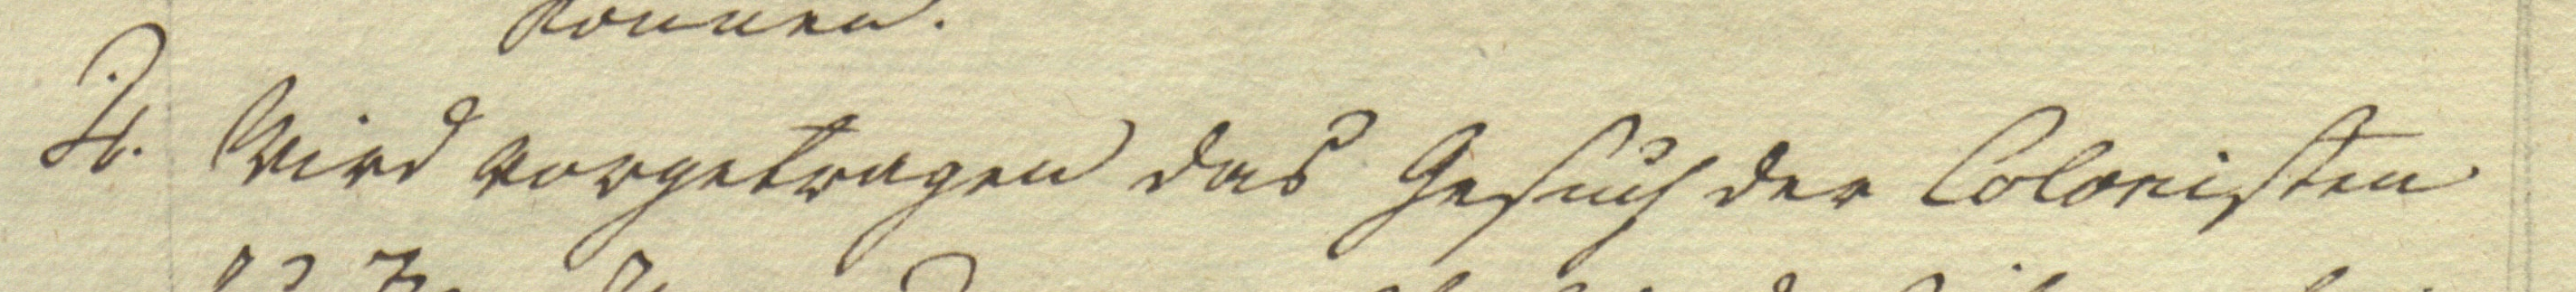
4. Wird vorgetragen das Gesuch der Colonisten
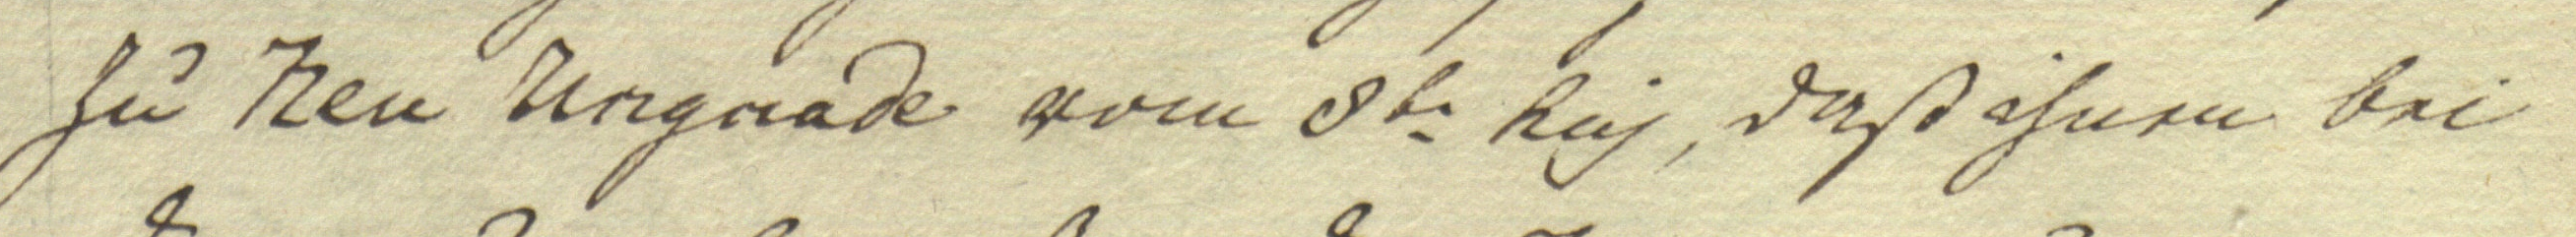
zu Neu Ungnade vom 8 te huj, daß ihnen bei
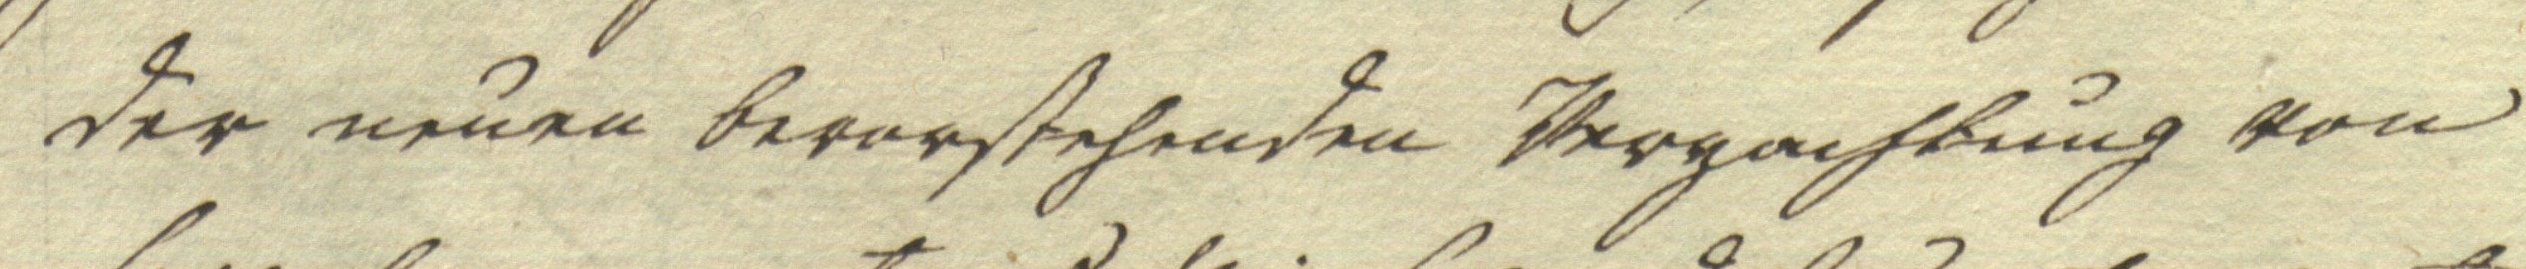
der neuen bevorstehenden Verpachtung von
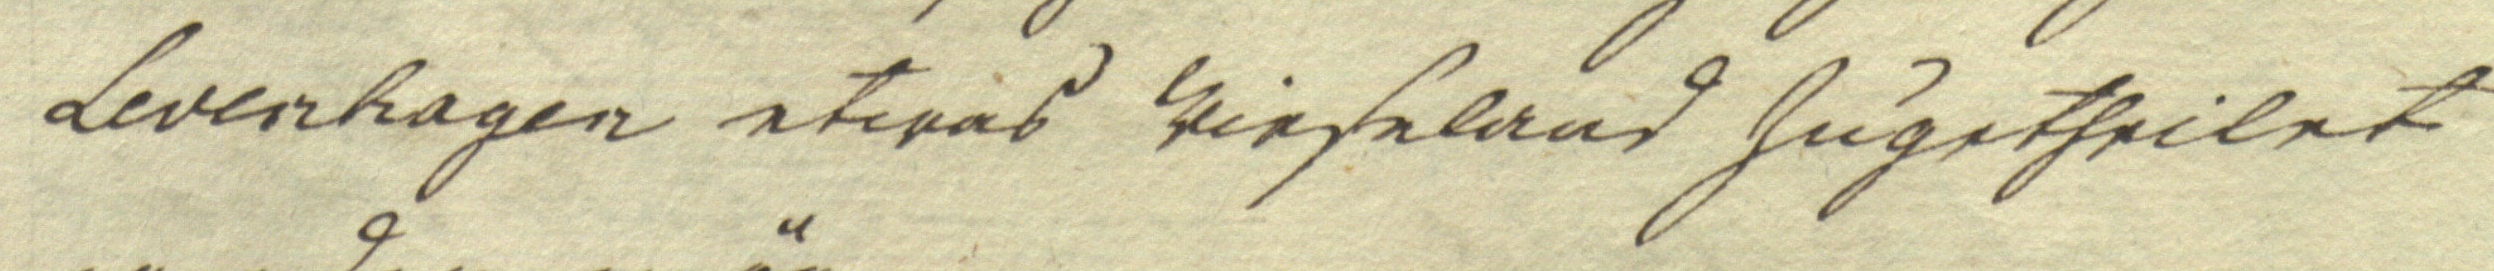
Levenhagen etwas Wieseland zugetheilet
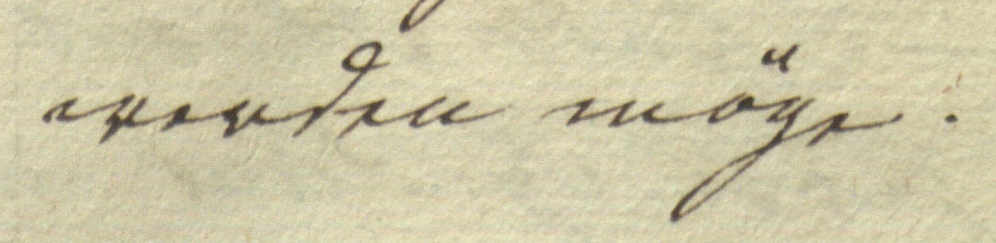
werden möge.
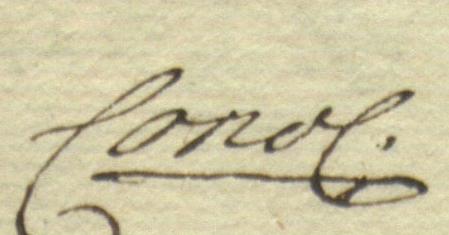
Concl.
